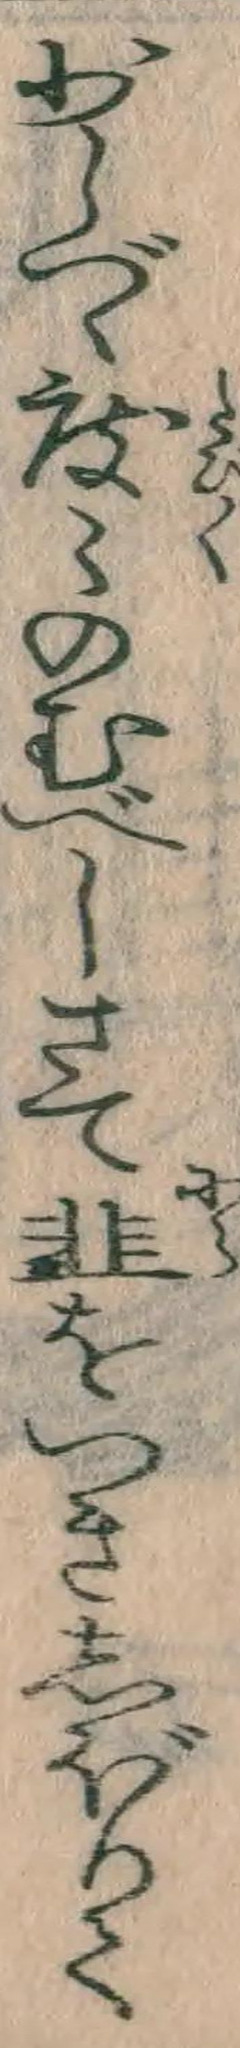少しづゝ度々のむべしさて韮をつきしぼりて
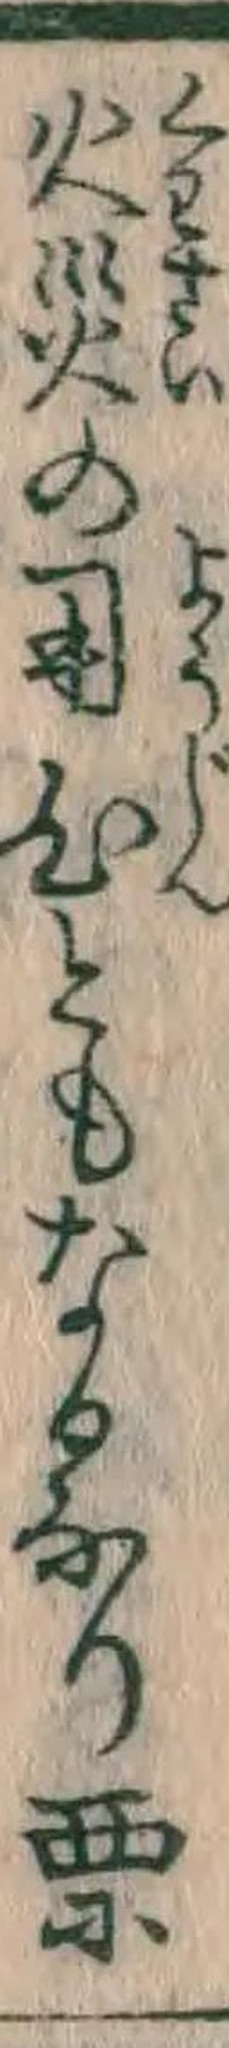火災の用心ともなるなり西に
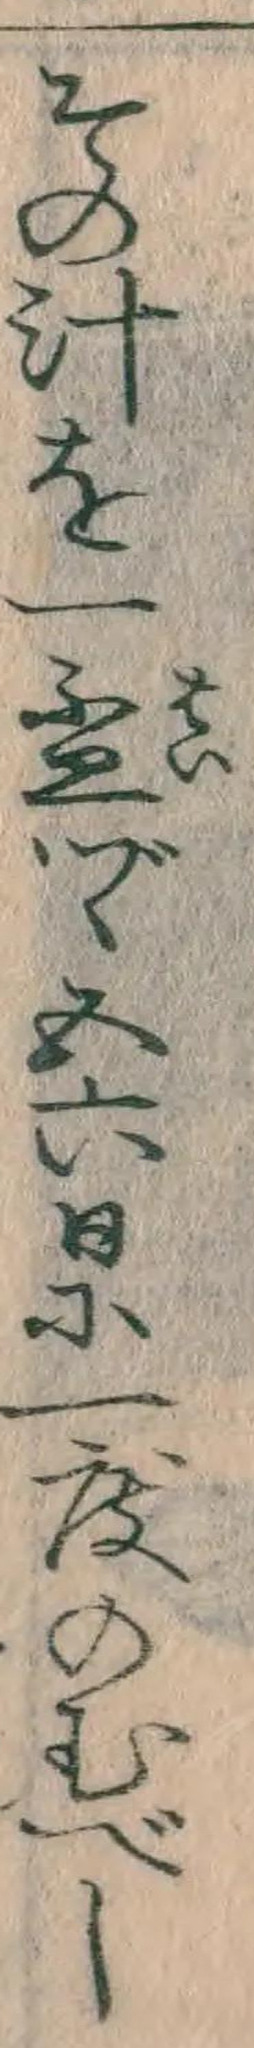その汁を一盃ヅヽ五六日に一度のむべし
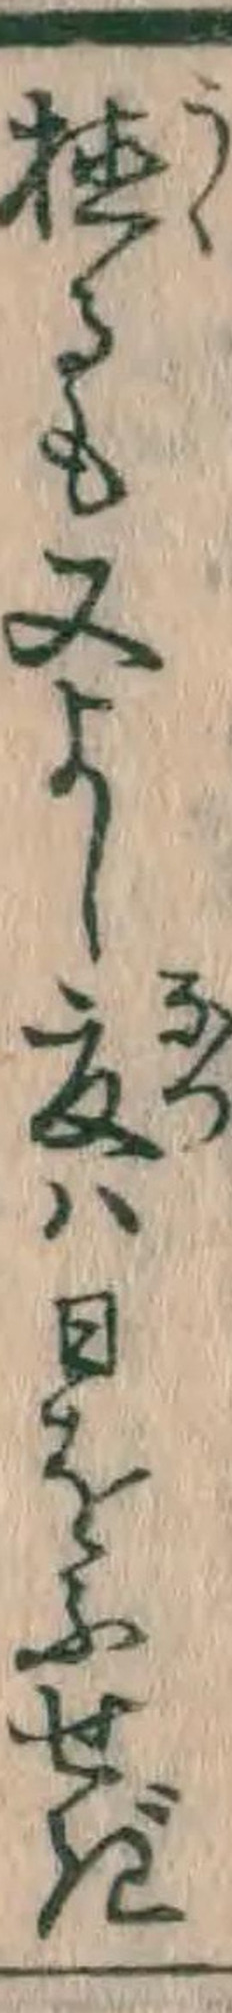植るも又よし夏は日をふせぎ
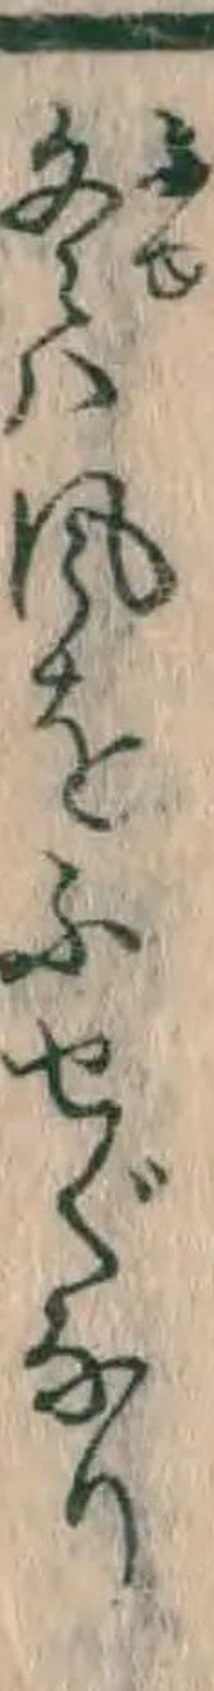冬は風をふせぐなり
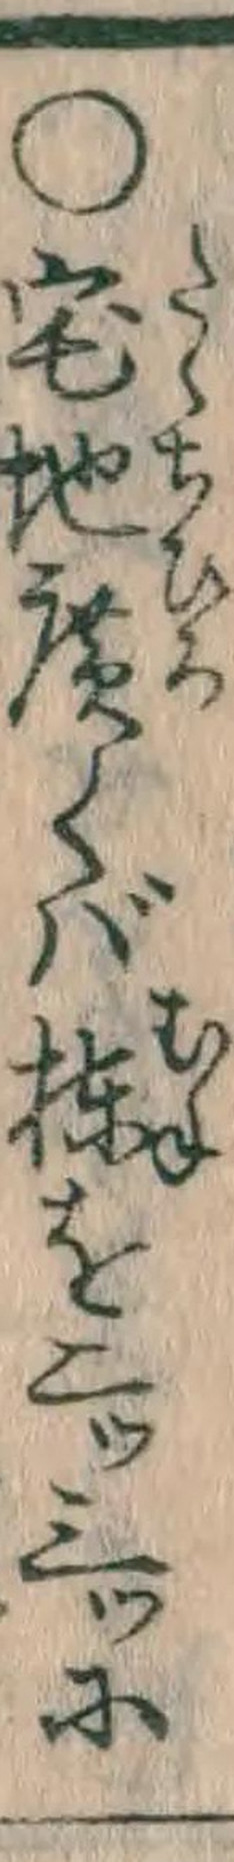○宅地広くば棟を二ッ三ッに
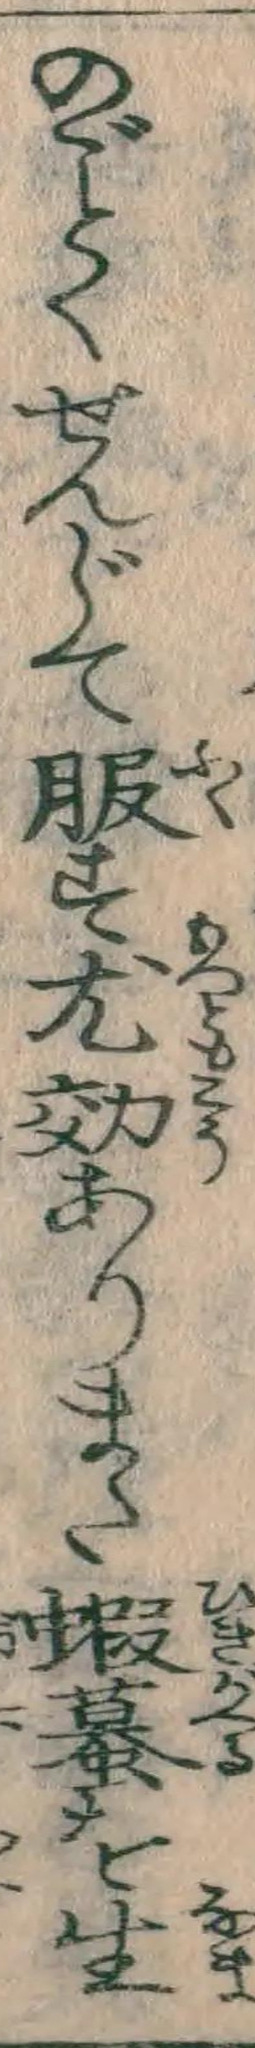のごとくせんじて服す尤効ありまた蝦蟇を生
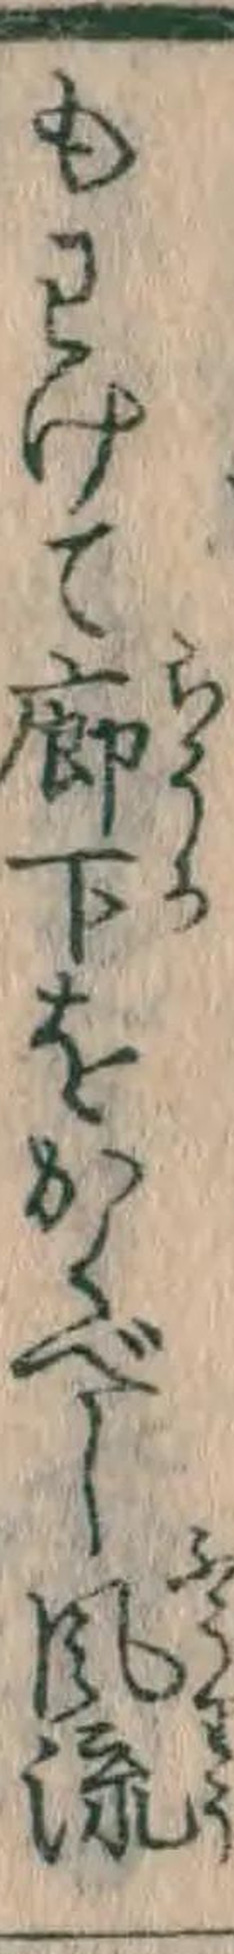もわけて廊下をかくべし風流
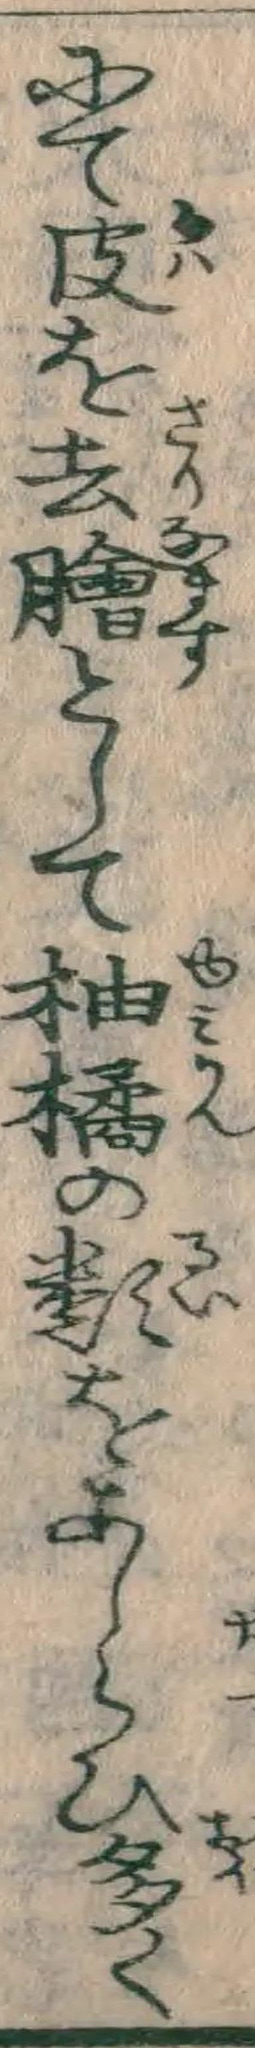にて皮を去膾として柚橘の類をあしらひ多く
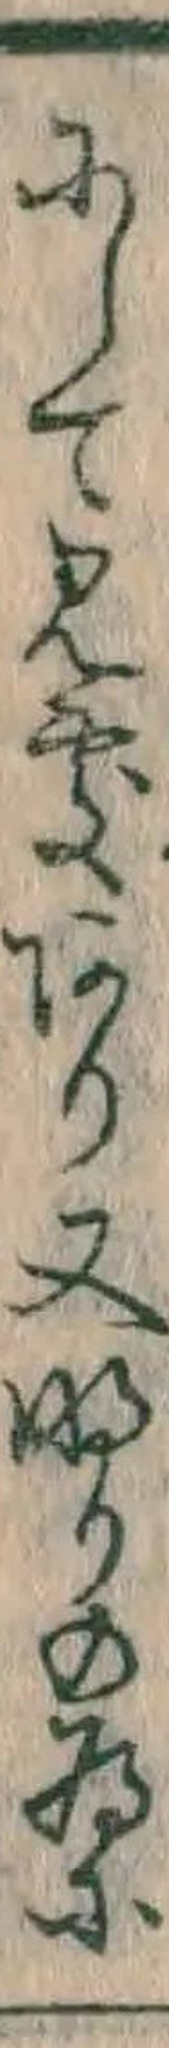にして見處あり又明りの為に
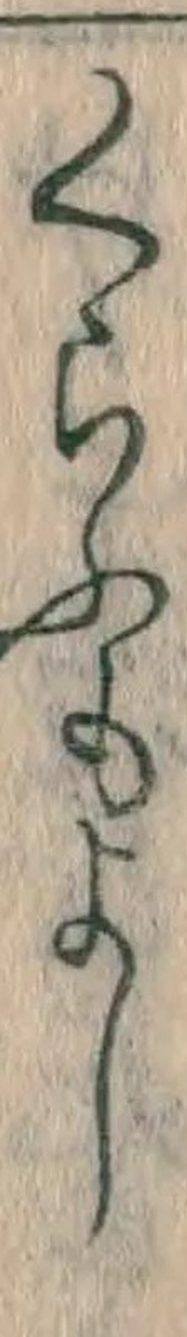くらふもよし
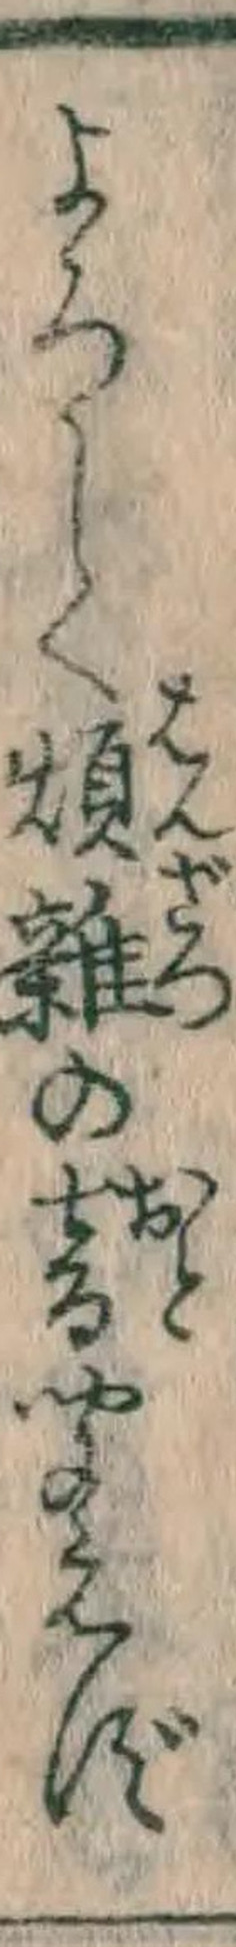よろしく煩雑の音聞えず
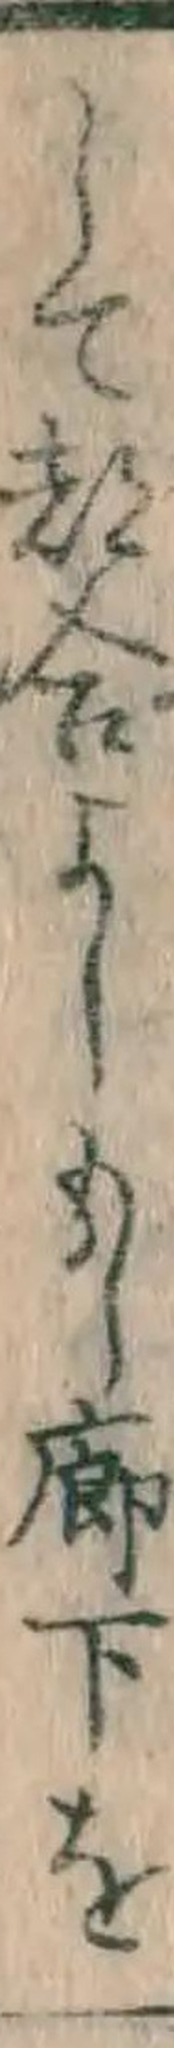して都合よしもし廊下を
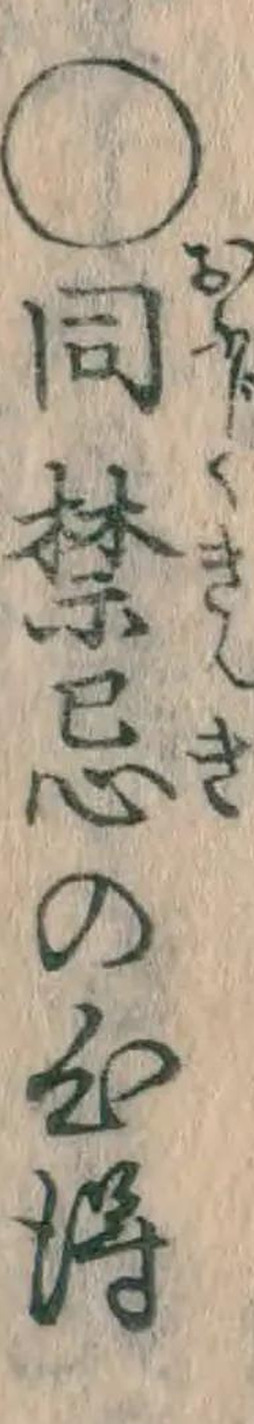○同禁忌の心得
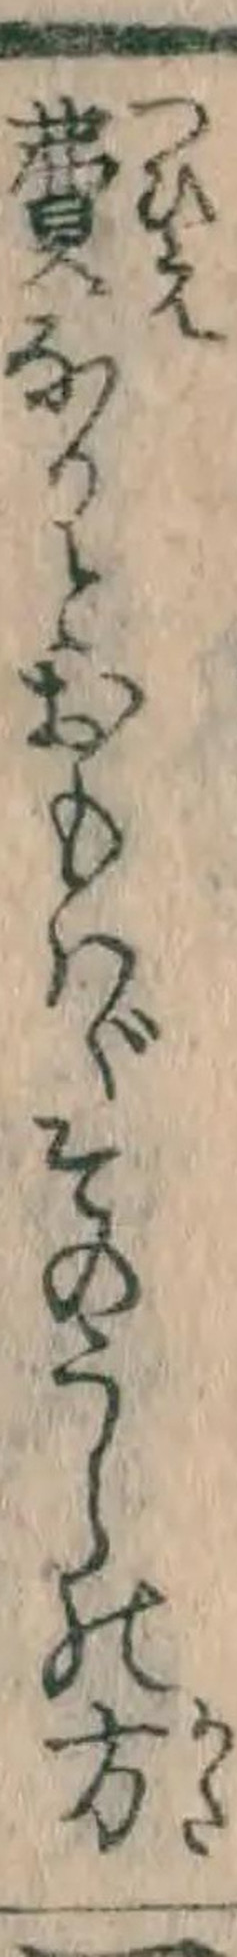費なりとおもはゞそのうらの方
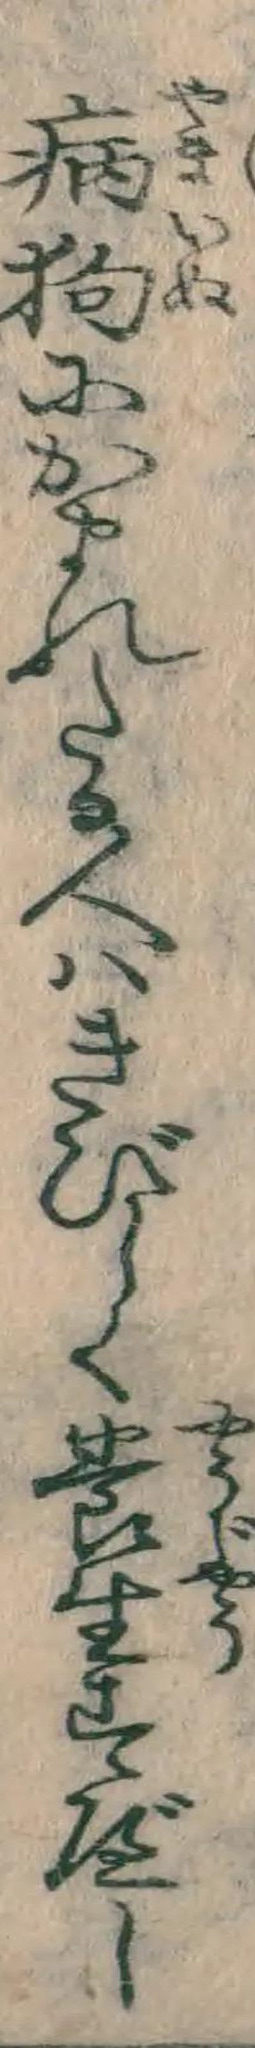一病狗にかまれたる人はきびしく養生すべし
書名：広益秘事大全 3巻. [3]
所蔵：国立国会図書館 National Diet Library, JAPAN
